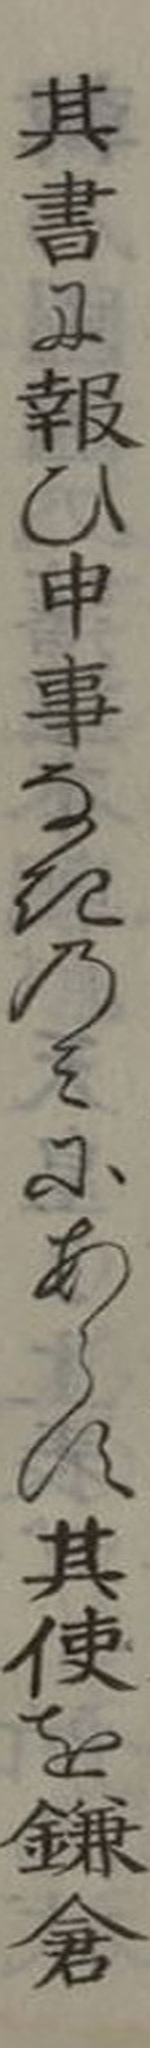其書に報ひ申事なきのミにあらす其使を鎌倉
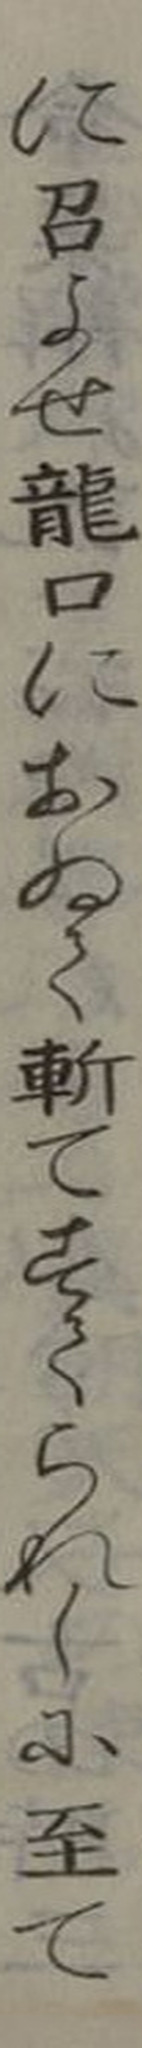に召よせ龍口におゐて斬てすてられしに至て
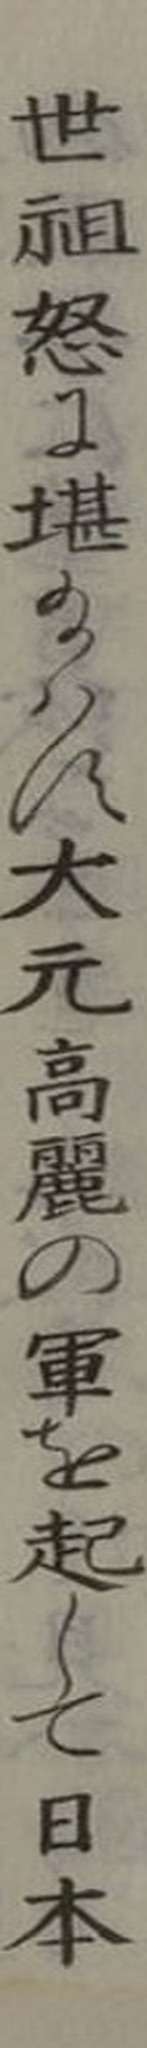世祖怒に堪給ハす大元高麗の軍を起して日本
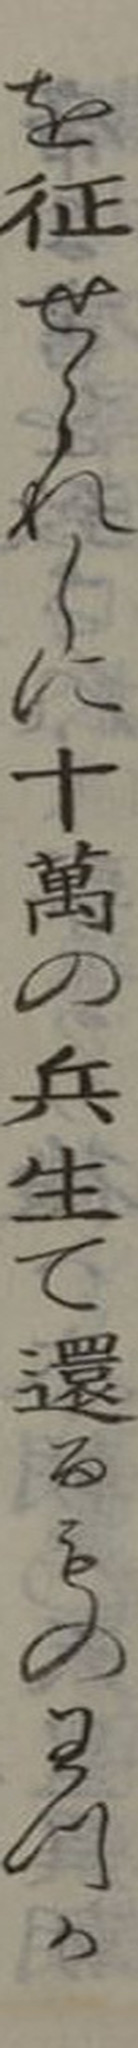を征せられしに十萬の兵生て還るものわつか
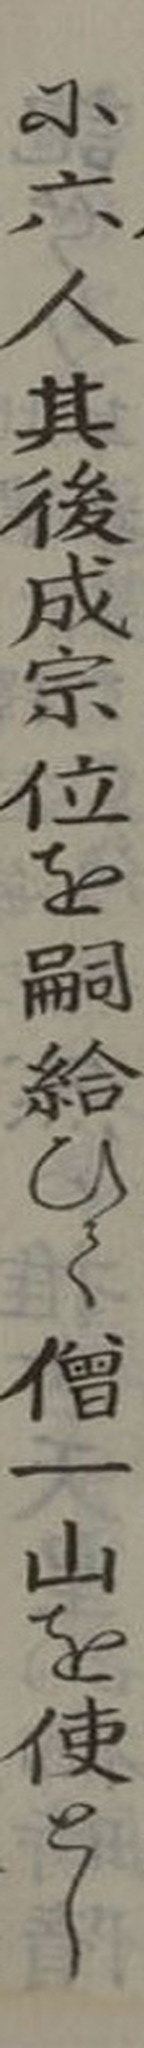に六人其後成宗位を嗣給ひて僧一山を使とし
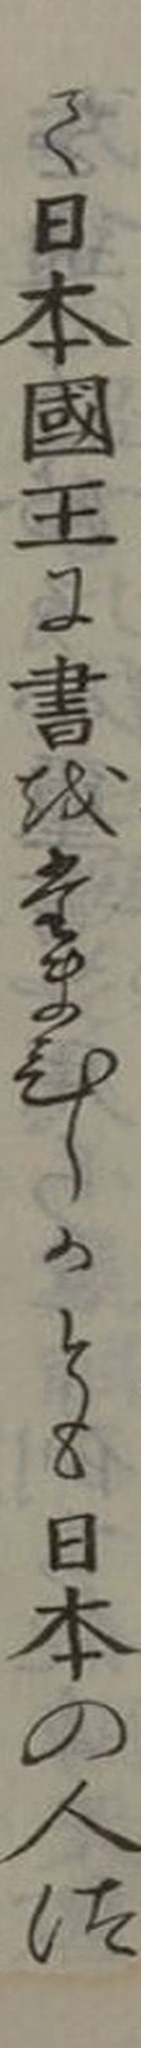て日本國王に書をたまひしかとも日本の人つ
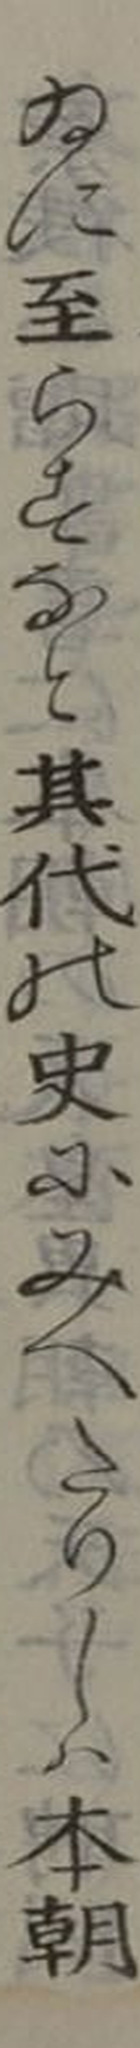ゐに至らさると其代の史にみへたりしハ本朝
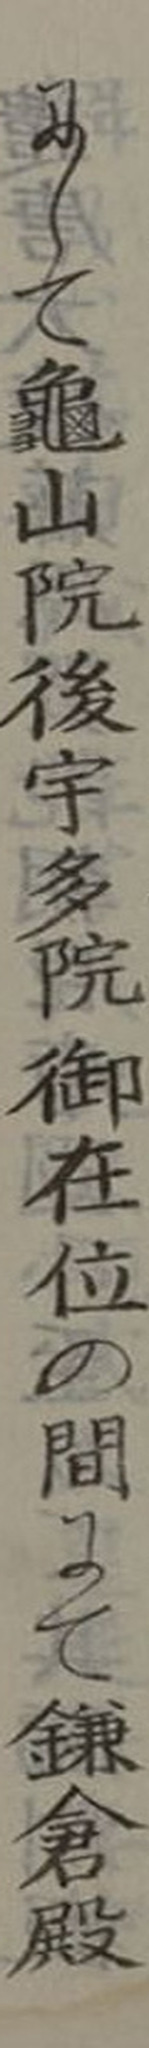にして龜山院後宇多院御在位の間にて鎌倉殿
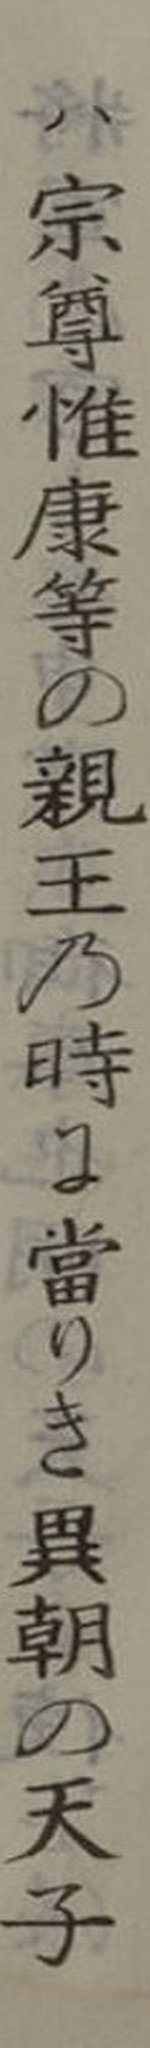ハ宗尊惟康等の親王の時に當りき異朝の天子
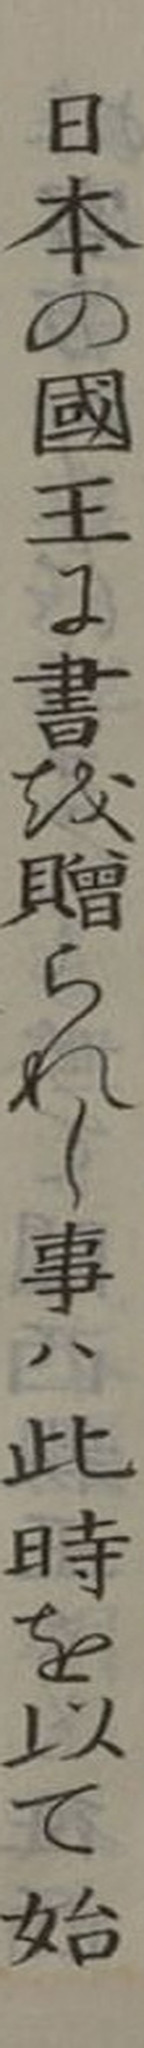日本の國王に書を贈られし事ハ此時を以て始
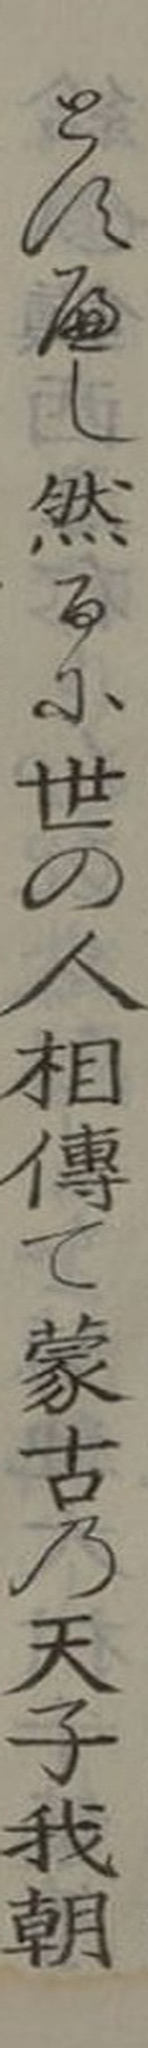とすへし然るに世の人相傳て蒙古の天子我朝
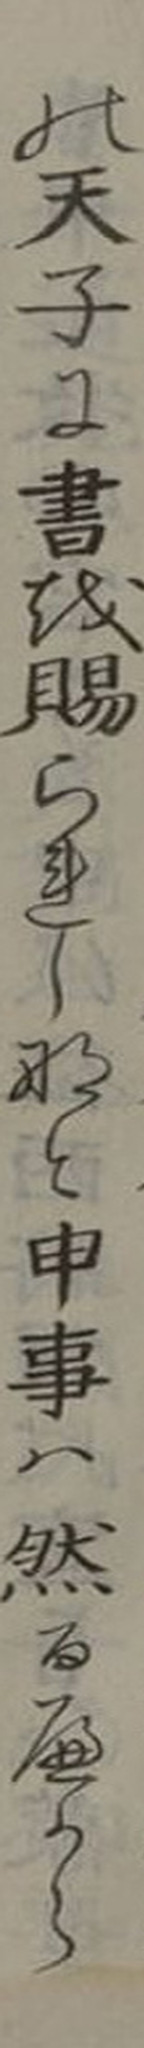の天子に書を賜られしなと申事ハ然るへから
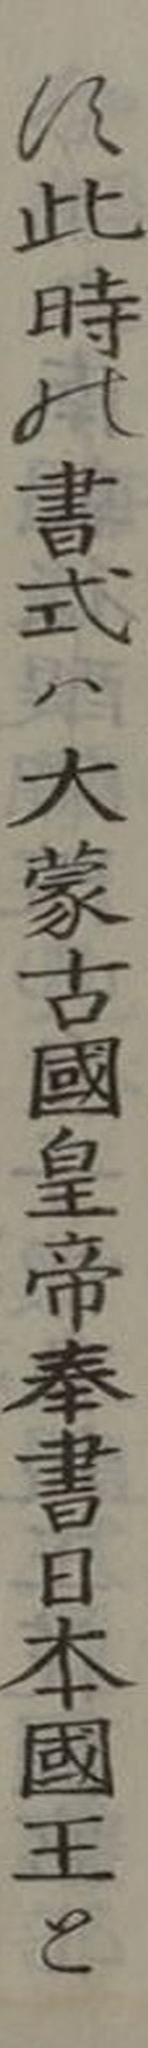す此時の書式ハ大蒙古國皇帝奉書日本國王と
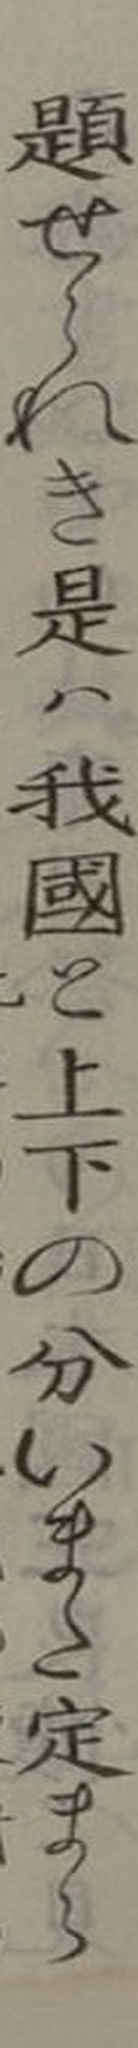題せられき是ハ我國と上下の分いまた定まら

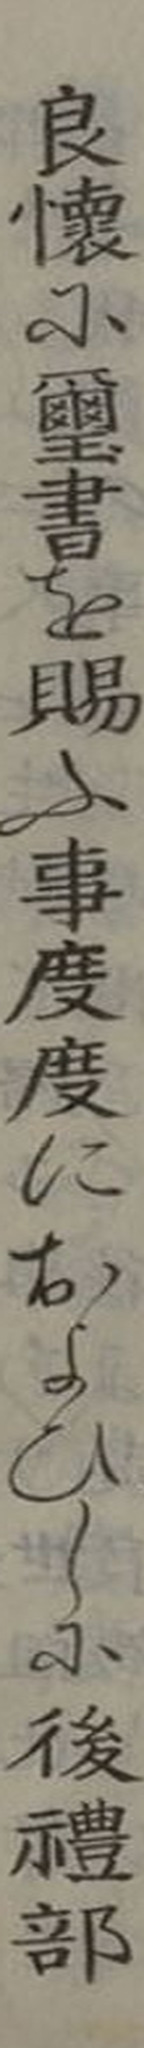良懷に璽書を賜ふ事度度におよひしに後禮部
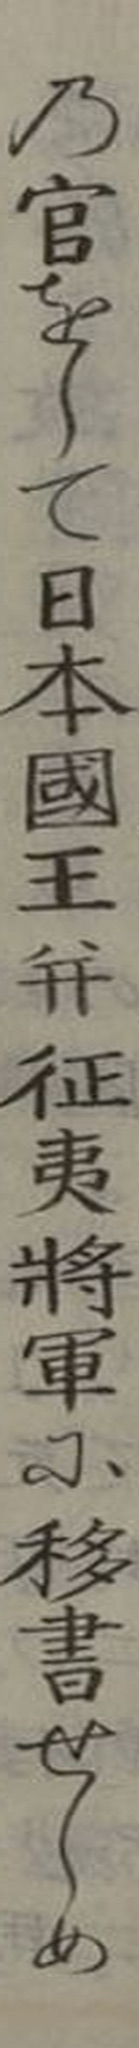の官をして日本國王并征夷將軍に移書せしめ
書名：骨董録
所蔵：University of the Ryukyus Library
